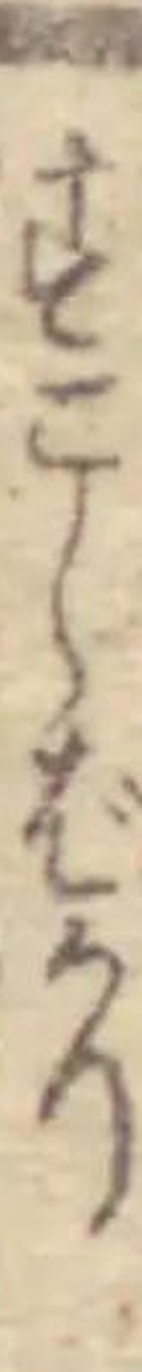すこしばかり
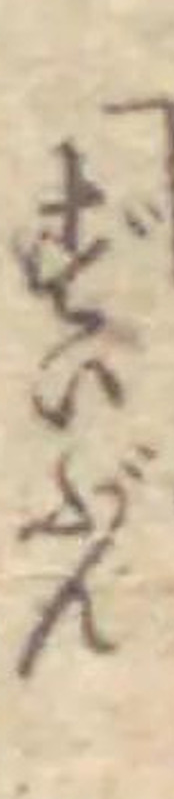〽ずいぶん
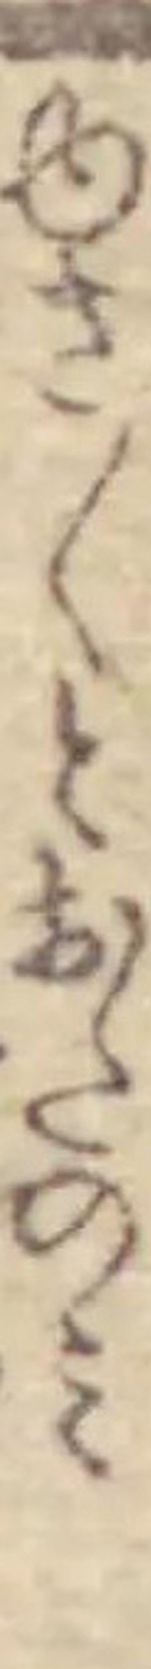ゆさ〳〵とおたのみ
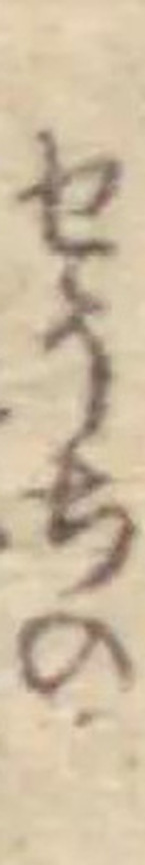せうちの
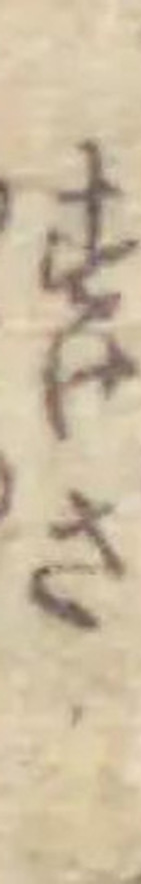すけさ
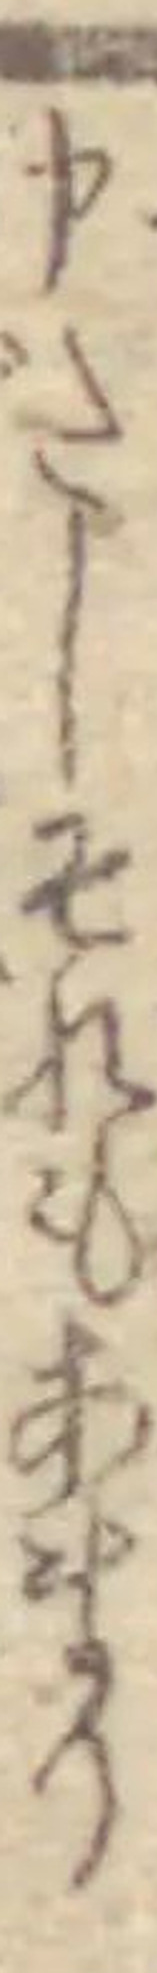申たしそれもあまり
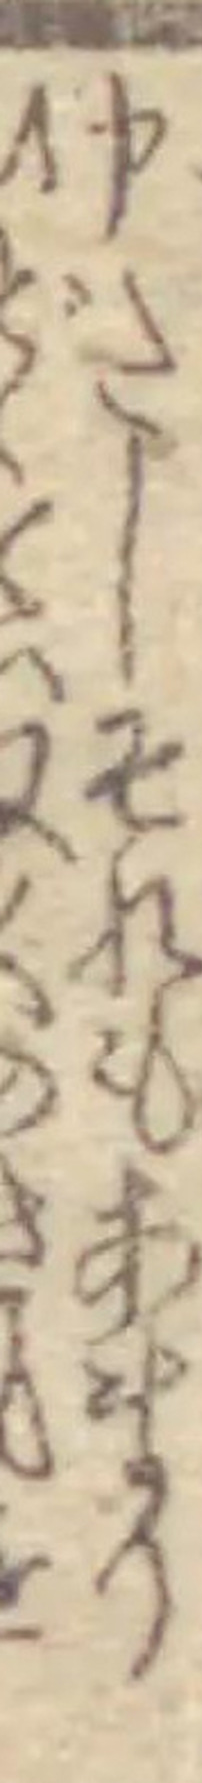ひどくては又人のきもを
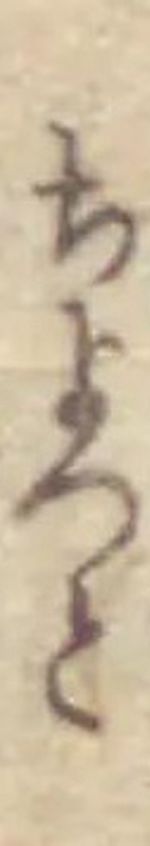ちよつと
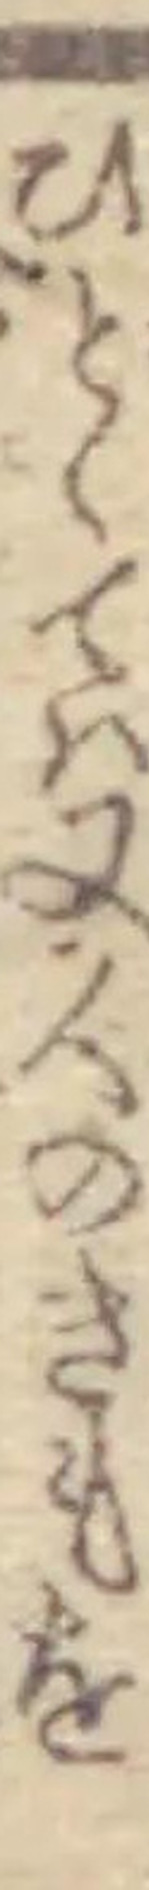ひどくては又人のきもを
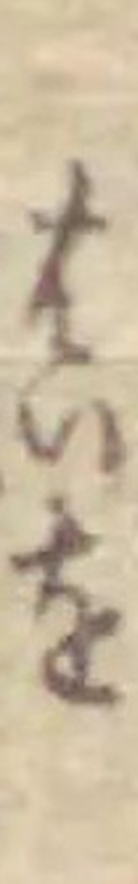はいを
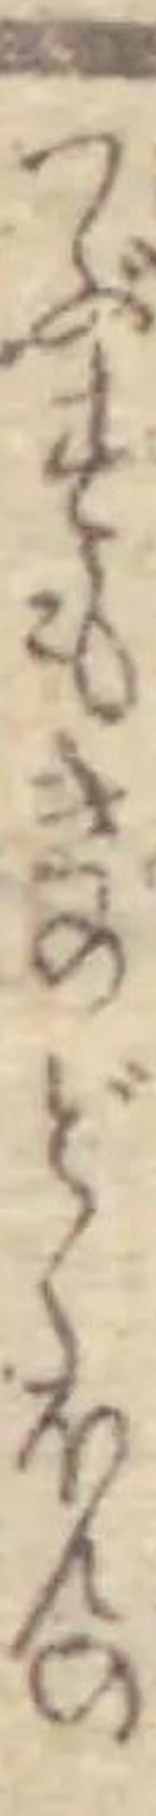つぶすもきのどくほんの
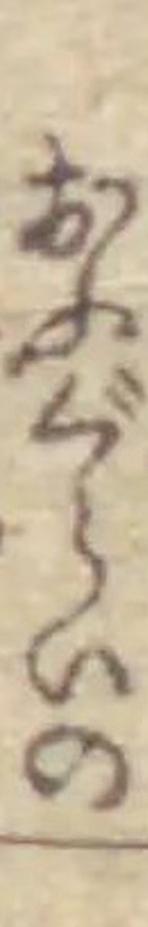おふぐらいの
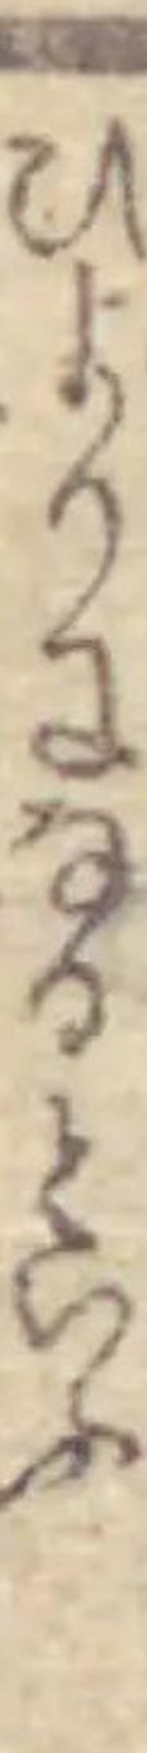ひよりになるといふ
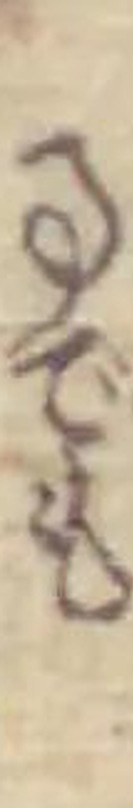事でも
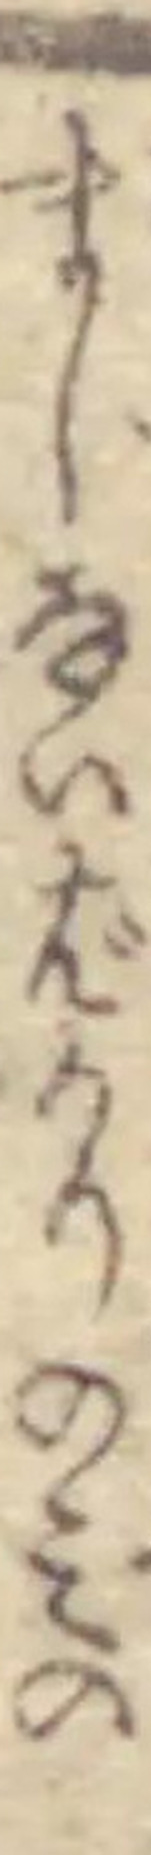まじないばかりのみの
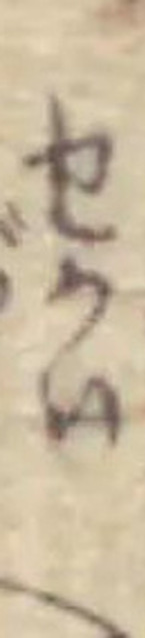せかい
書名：雨宮風宮出儘略縁記 3巻
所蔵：国立国会図書館 National Diet Library, JAPAN
